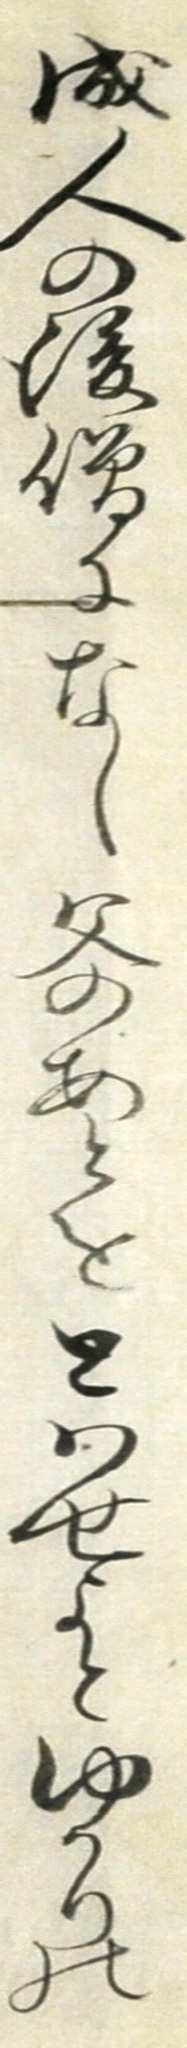成人の後僧になし父のあとをとはせよとゆかりの
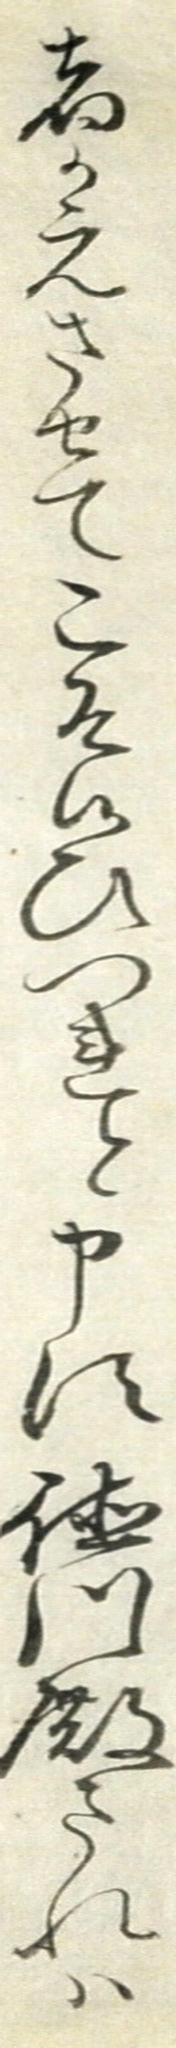者かえさせてこそ候ひつれと申す徳川殿されは
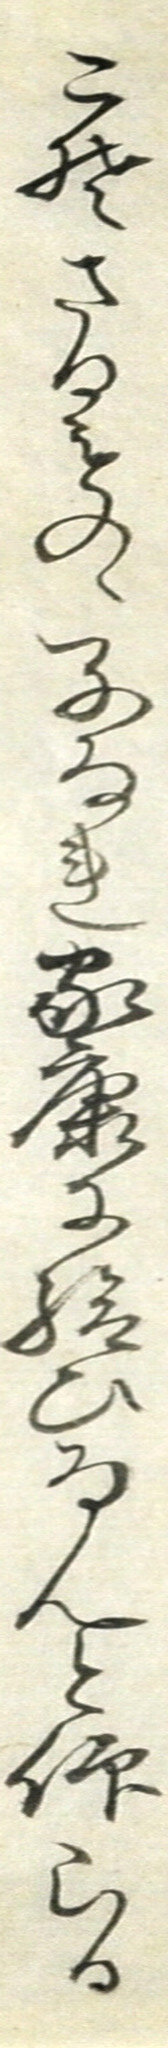こそさるものゝ子なれ家康に給ひなんと仰らる
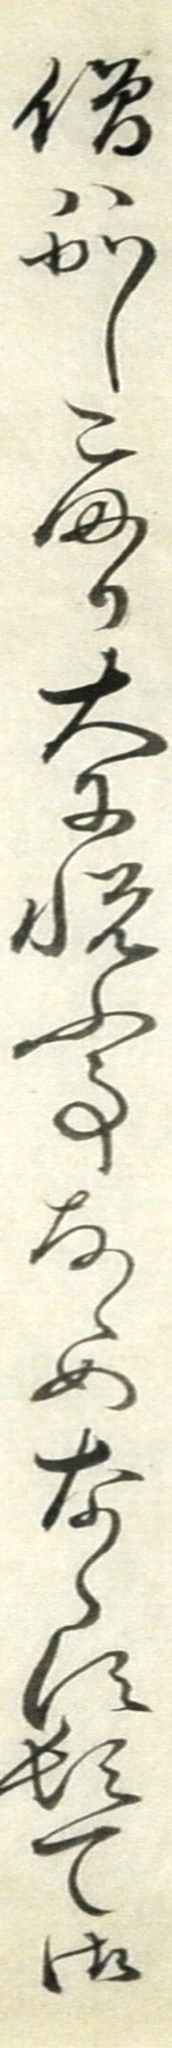僧はかしこまり大に悦ふ事なゝめならす頓て御
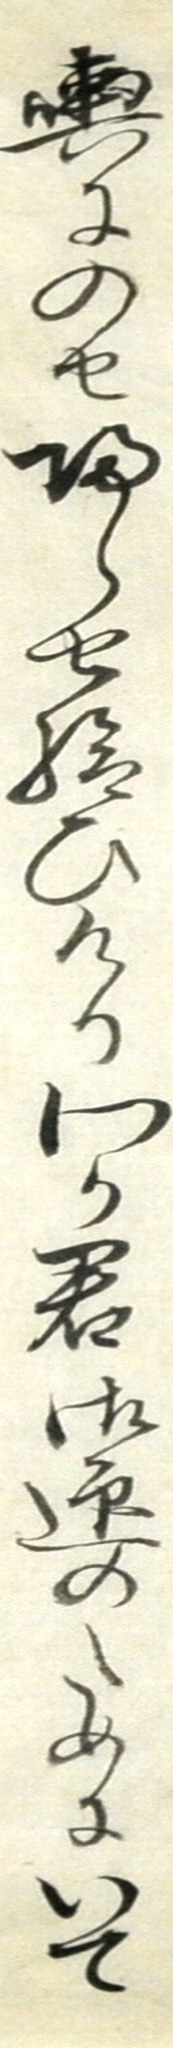輿にのせ帰らせ給ひけりわか君御迎えのためにいて
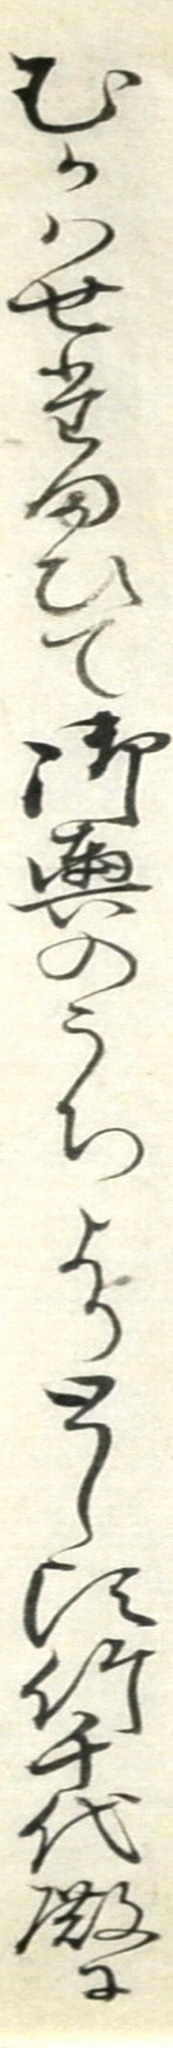むかはせたまひて御輿のうちよりとし頃竹千代殿に
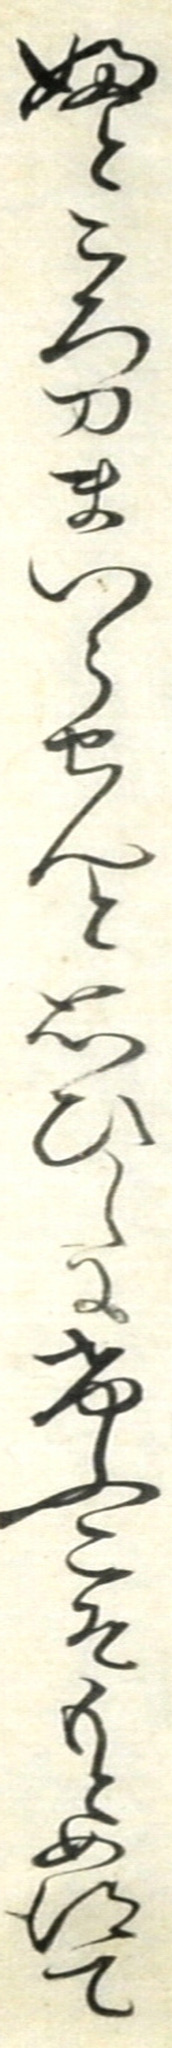ふところ刀まいらせんと思ひしにけふこそもとめ得て
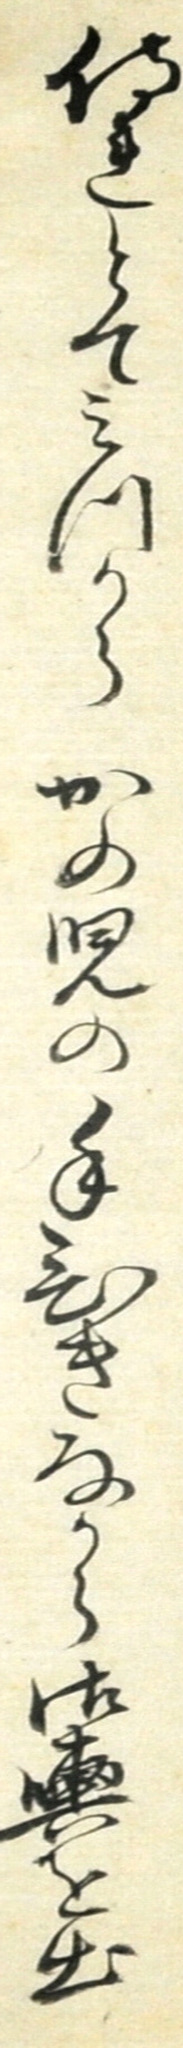侍れとてみつからかの児の手ひきなから御輿を出
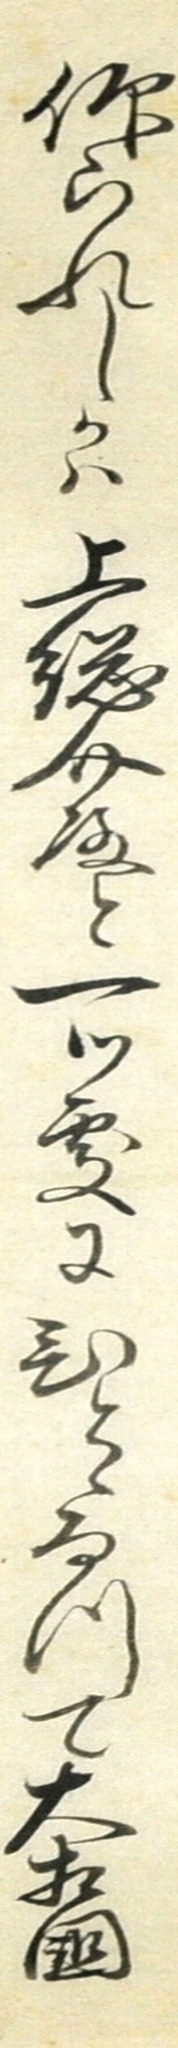仰られしかは上総介殿と一ツ処にひとゝなつて大相国
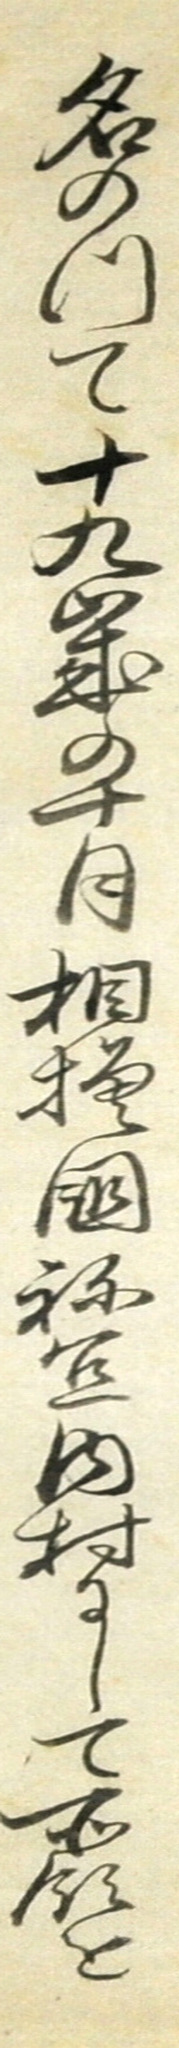名のつて十九歳の十月相模国禰宜内村にして所領を
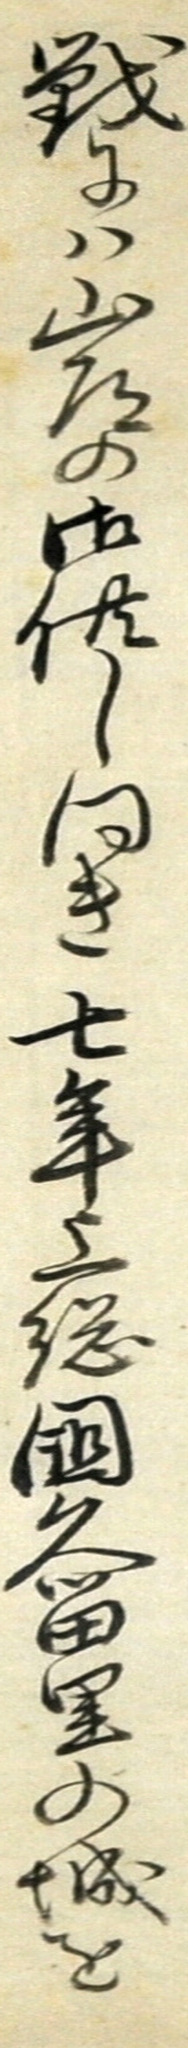戦には山道の御供し同き七年上総国久留里の城を

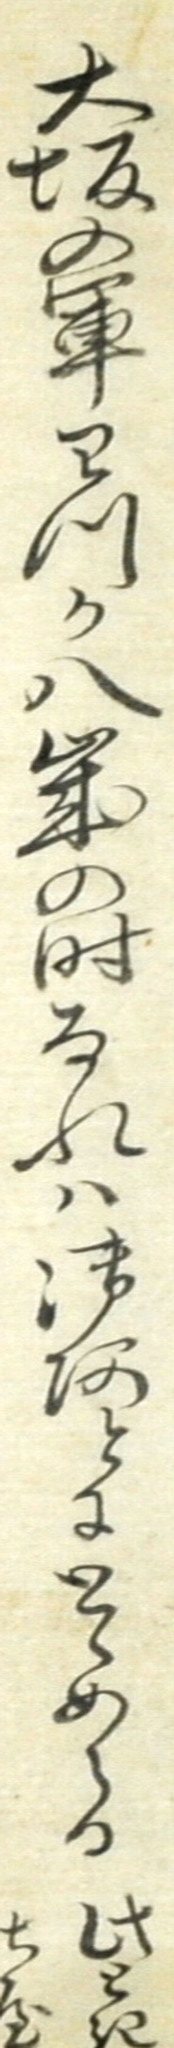大坂の軍わつか八歳の時なれは御あとにとゝめらる此とき土屋
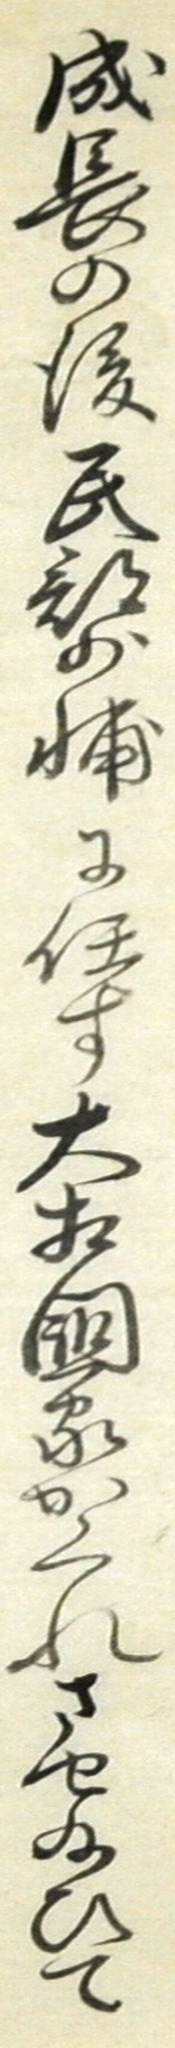成長の後民部少輔に任す大相国家かくれさせ給ひて
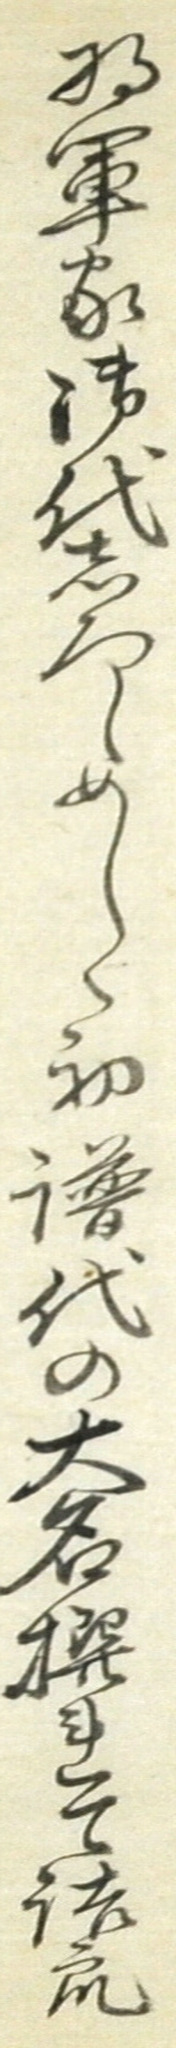将軍家御代しろしめしゝ初譜代の大名撰れて諸衆
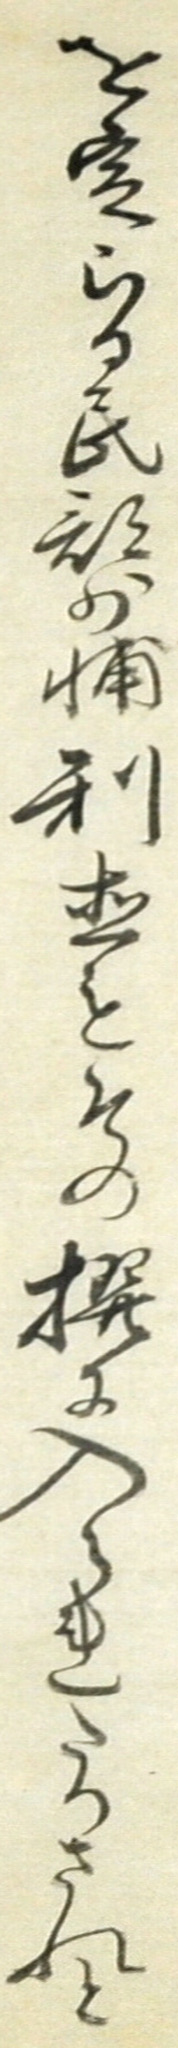を定らる民部少輔利直もその撰に入られたりされと
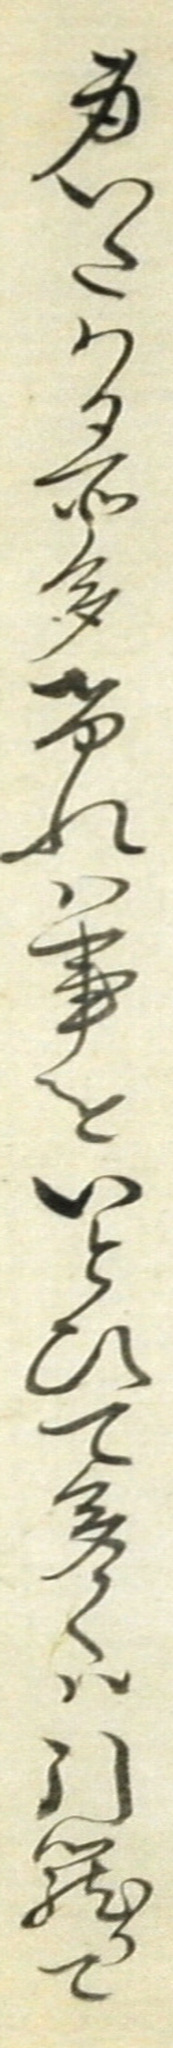身いたわる所多けれは事をいとひて多くは引籠りて
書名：藩翰譜（六）
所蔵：伊那市立高遠町図書館・合同会社AMANE
